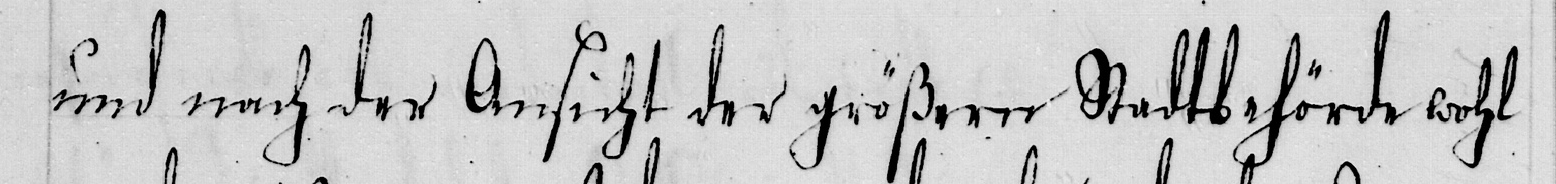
und nach der Ansicht der größeren Stadtbehörde wohl
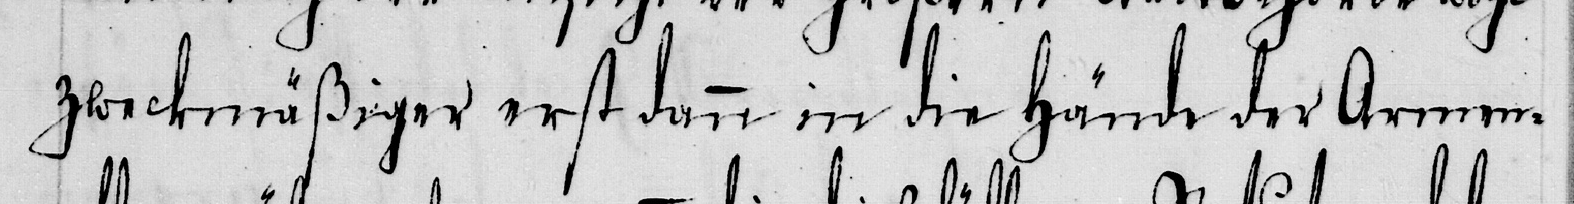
zweckmäßiger erst dann in die Hände der Armen¬
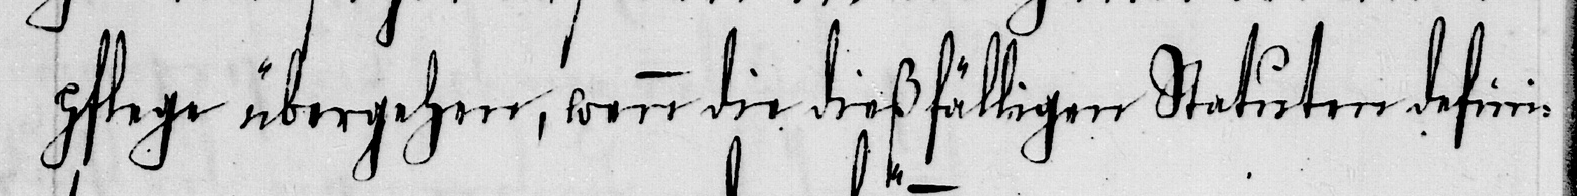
pflege übergehen, wenn die dießfälligen Statuten defini¬
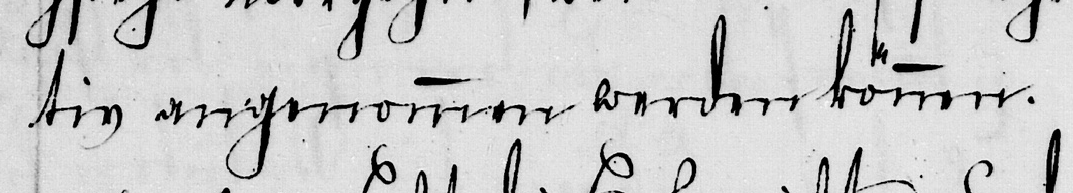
tiv angenommen werden können.
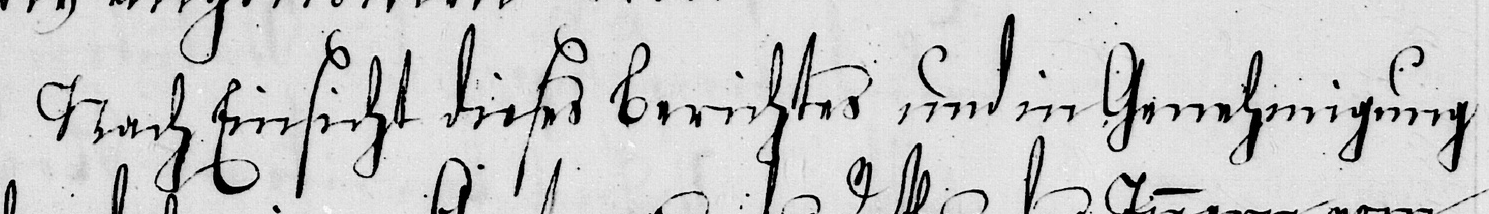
Nach Einsicht dieses Berichtes und in Genehmigung
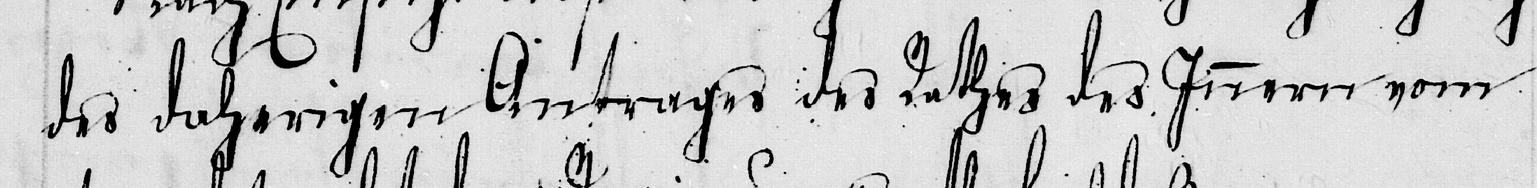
des daherigen Antrages des Rathes des Innern vom
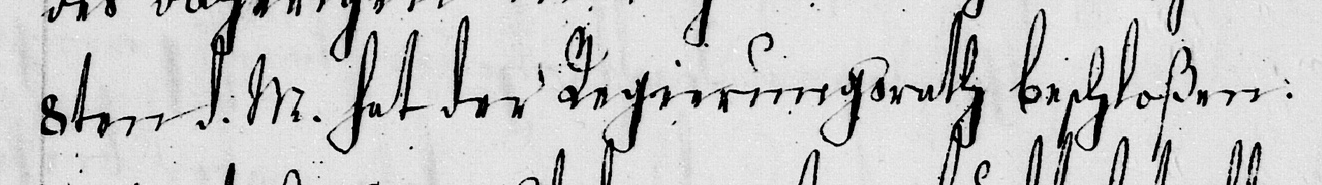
8ten d. M. hat der Regierungsrath beschloßen:
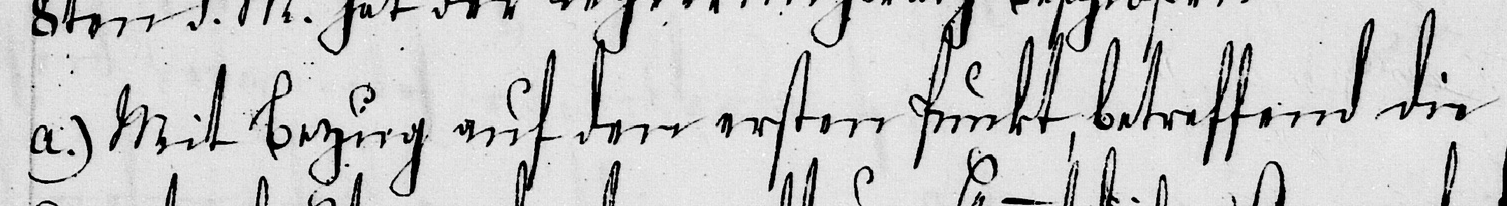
a.) Mit Bezug auf den ersten Punkt, betreffend die
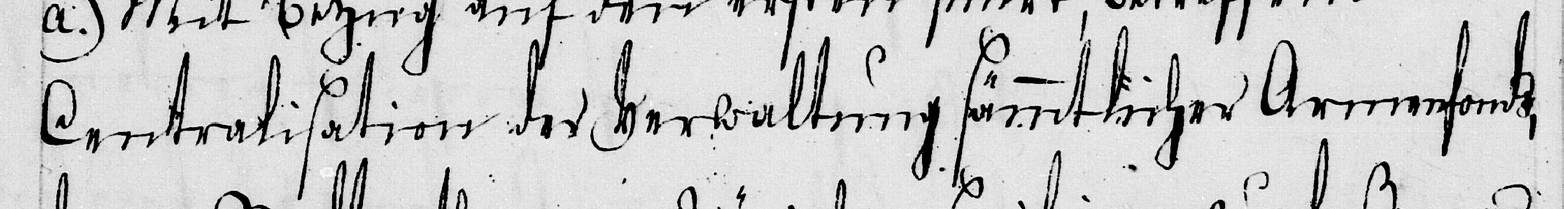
Centralisation der Verwaltung sämmtlicher Armenfonds,
